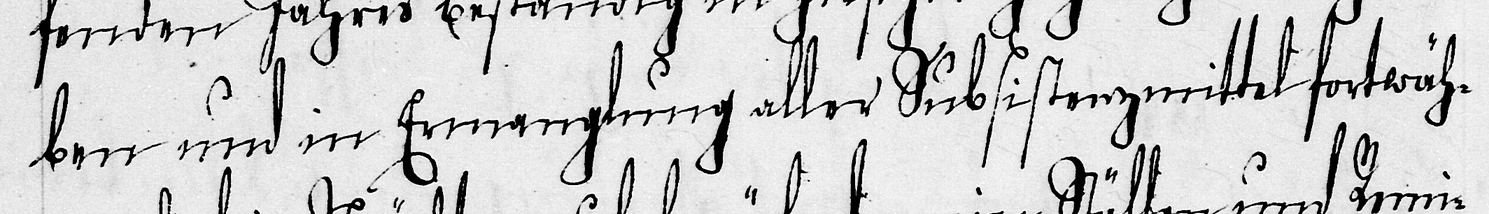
ben und in Ermangelung aller Subsistenzmittel fortwäh¬
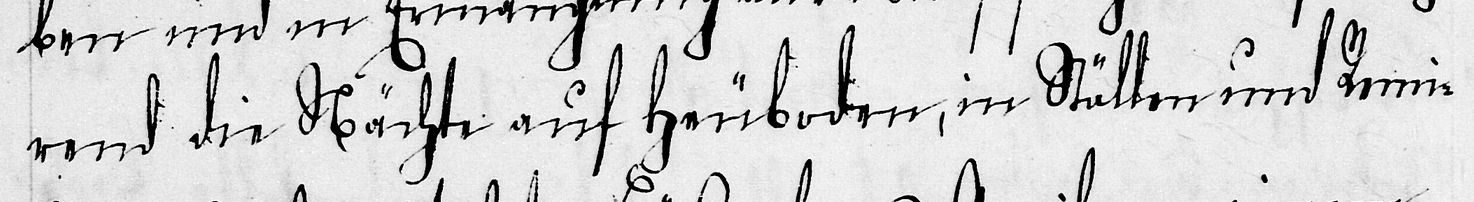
rend die Nächte auf Heuboden, in Ställen und Remi¬
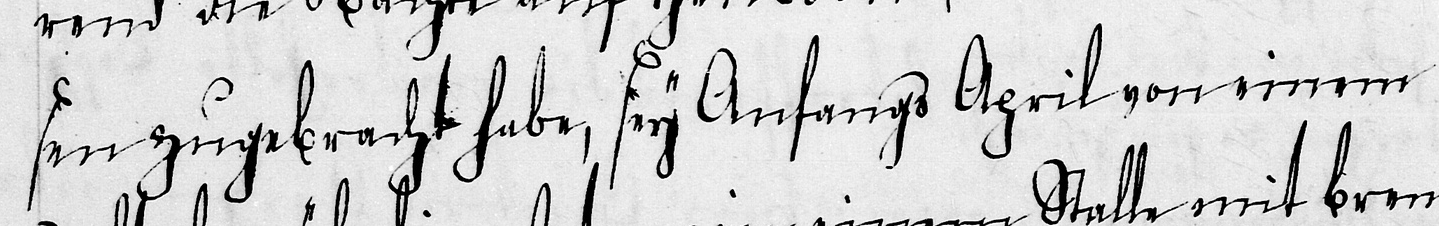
sen zugebracht habe, sey Anfangs April von einem
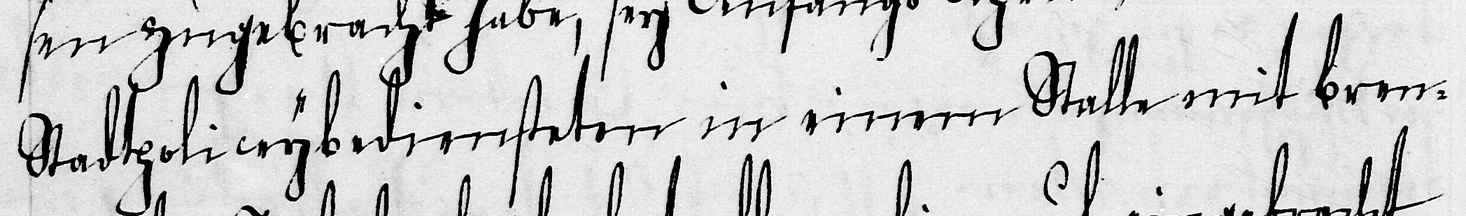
Stadtpoliceybediensteten in einem Stalle mit bren¬
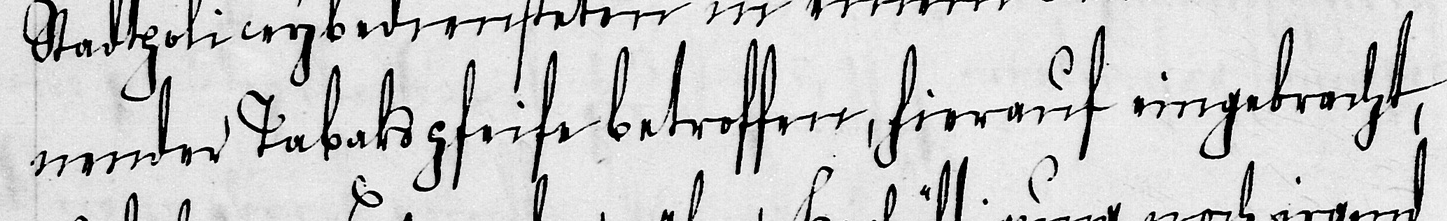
nender Tabakspfeife betroffen, hierauf eingebracht,
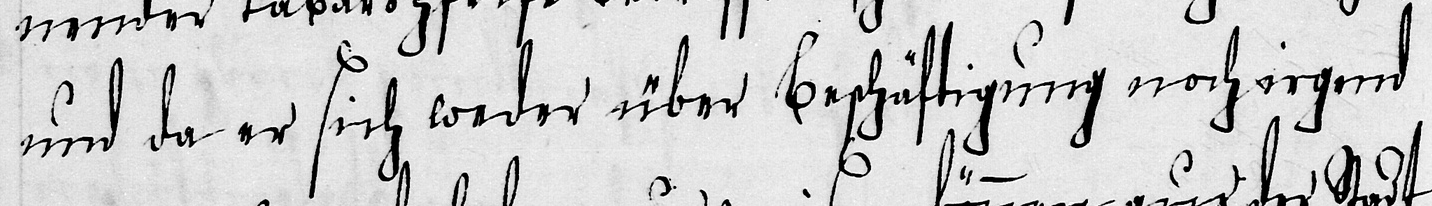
und da er sich weder über Beschäftigung noch irgend
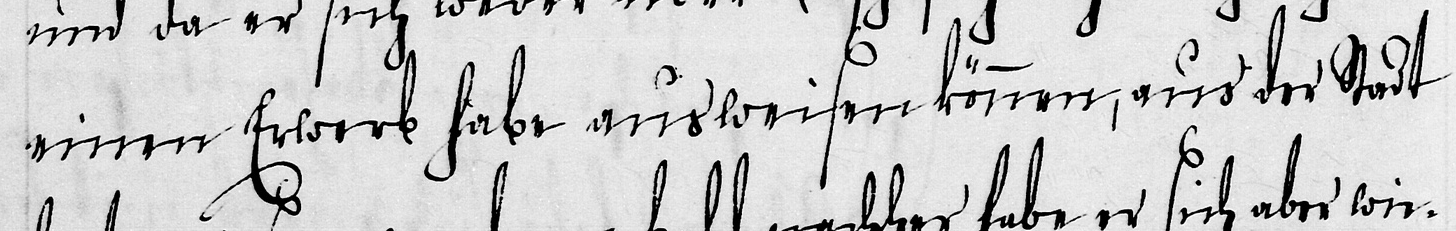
einen Erwerb habe ausweisen können, aus der Stadt
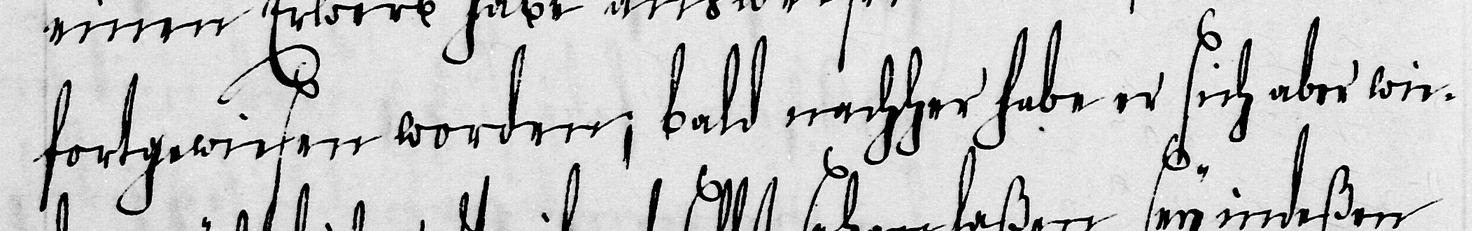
fortgewiesen worden, bald nachher habe er sich aber wi¬
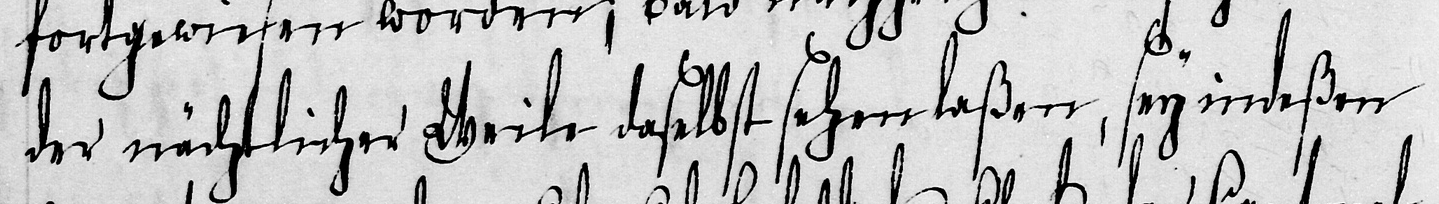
eder nächtlicher Weile daselbst sehen laßen, sey indeßen
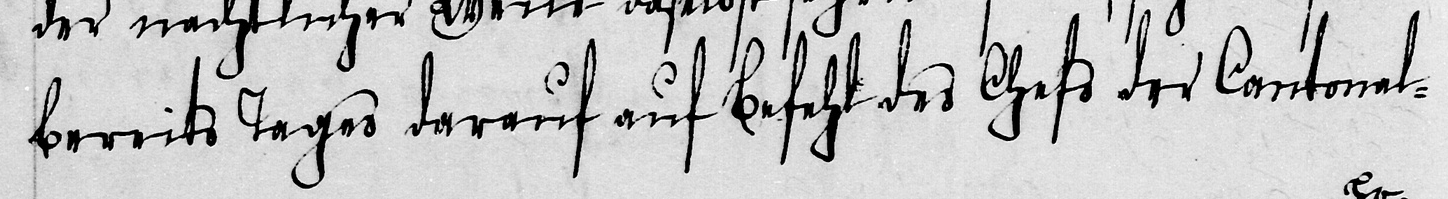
bereits Tages darauf auf Befehl des Chefs der Cantonal-
